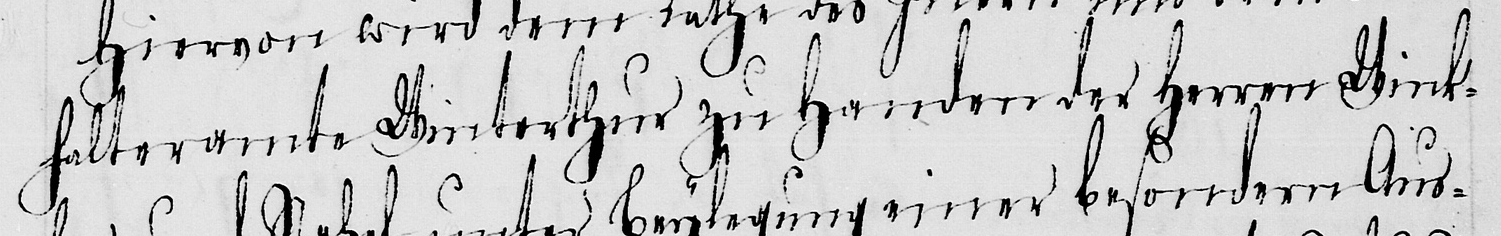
halteramte Winterthur zu Handen der Herren Wink¬
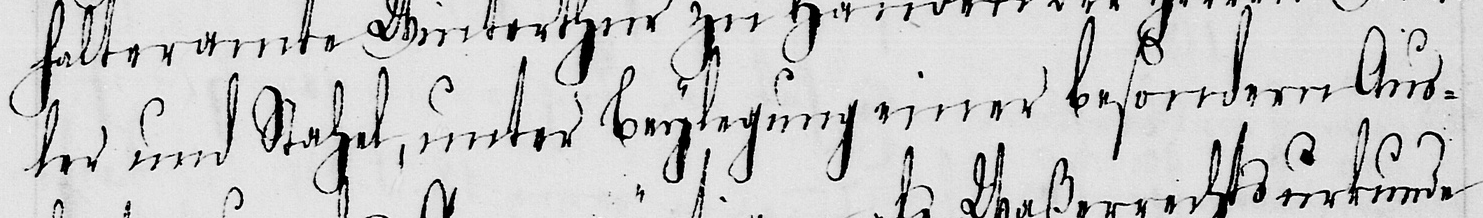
ler und Stahel, unter Beylegung einer besondern Aus¬
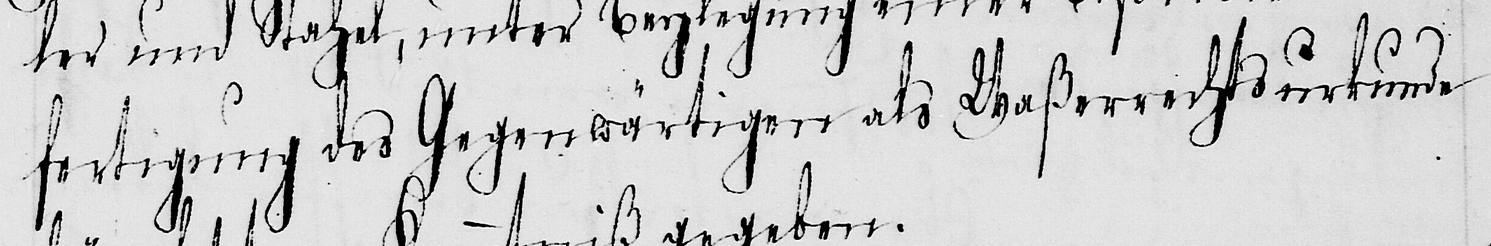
fertigung des Gegenwärtigen als Waßerrechtsurkunde
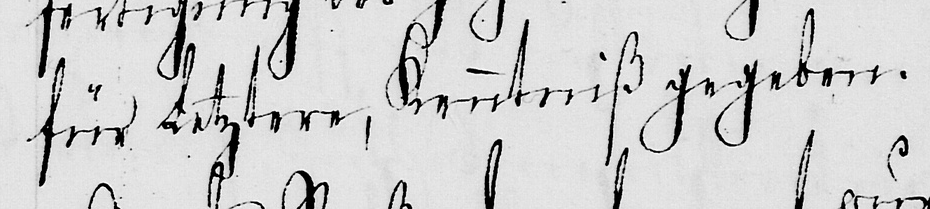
für Letztern, Kenntniß gegeben.
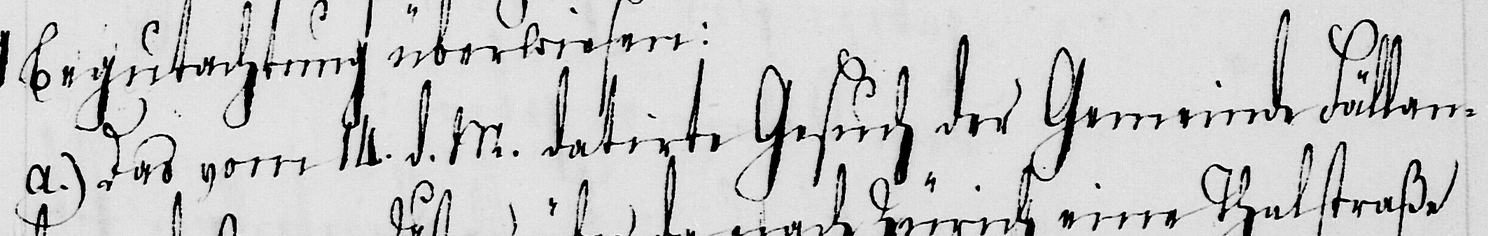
a.) Das vom 14. d. M. datirte Gesuch der Gemeinde Fällan¬
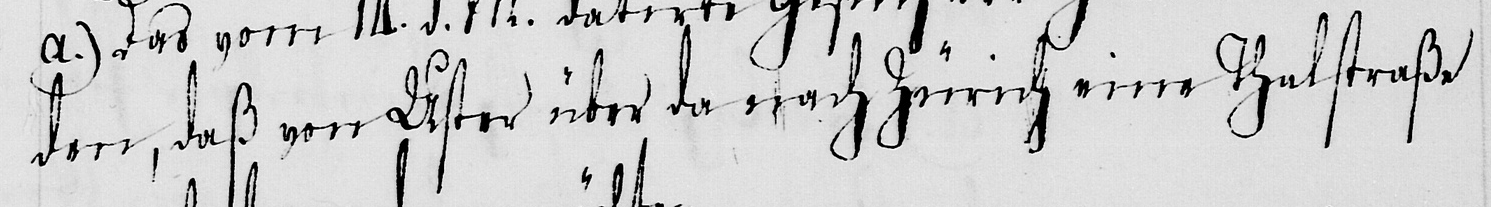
den, daß von Uster über da nach Zürich eine Thalstraße
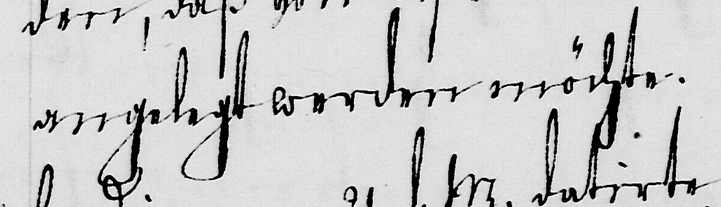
angelegt werden möchte.
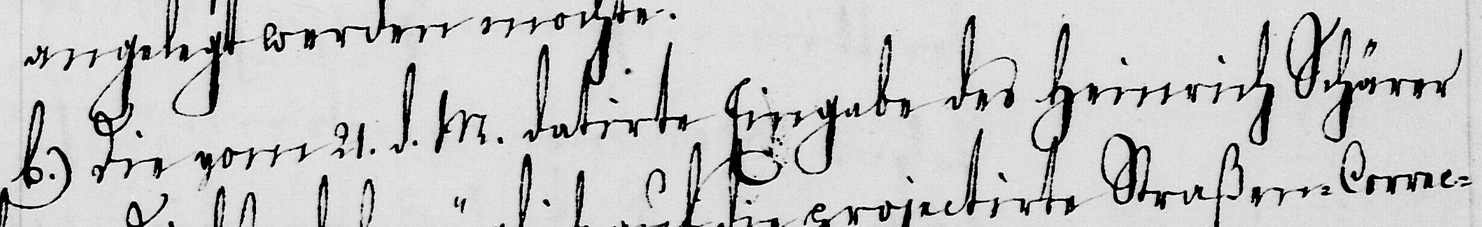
b.) Die vom 21. d. M. datirte Eingabe des Heinrich Schärer
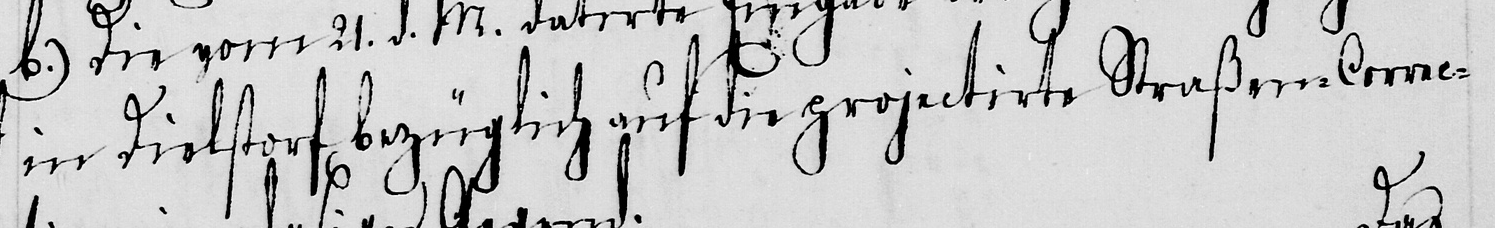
in Dielsdorf bezüglich auf die projectirte Straßen-Corre¬
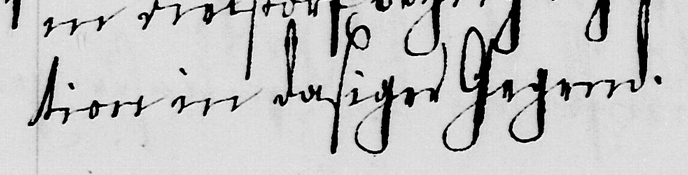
ction in dasiger Gegend.
